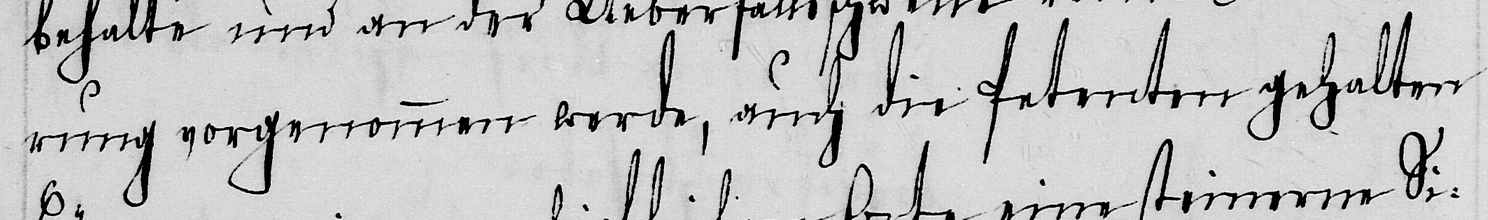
rung vorgenommen werde, auch die Petenten gehalten
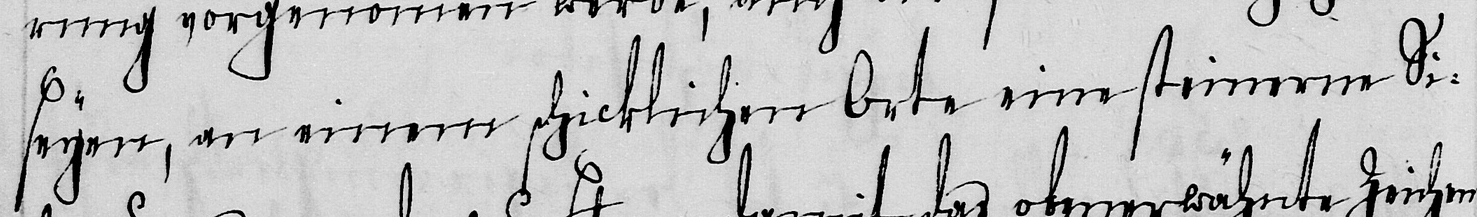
seyen, an einem schicklichen Orte eine steinerne Si¬
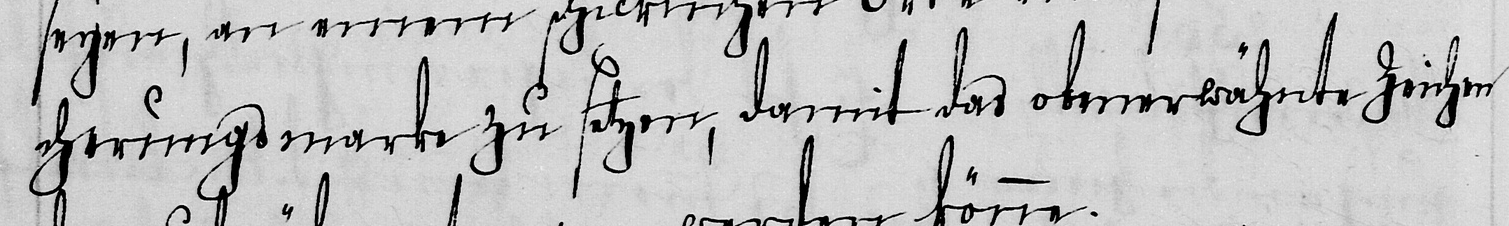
cherungsmarke zu setzen, damit das obenerwähnte Zeichen
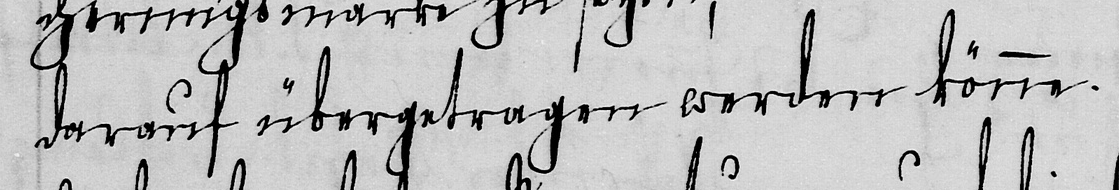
darauf übertragen werden könne.
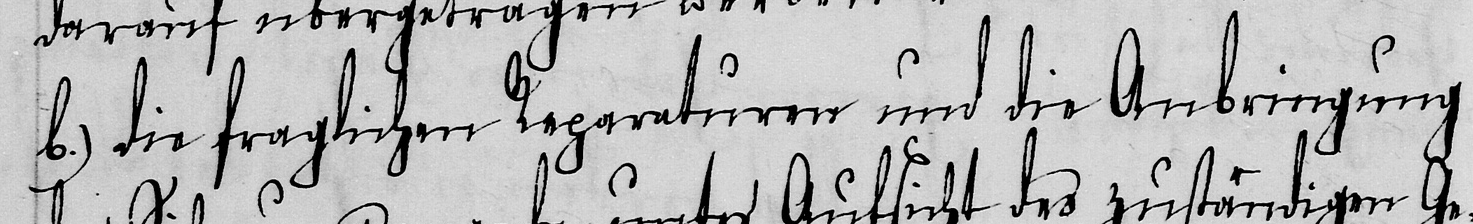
b.) die fraglichen Reparaturen und die Anbringung
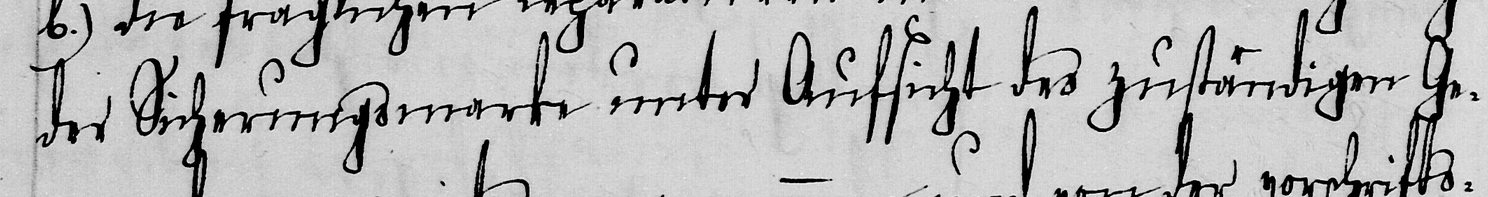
der Sicherungsmarke unter Aufsicht des zuständigen Ge¬
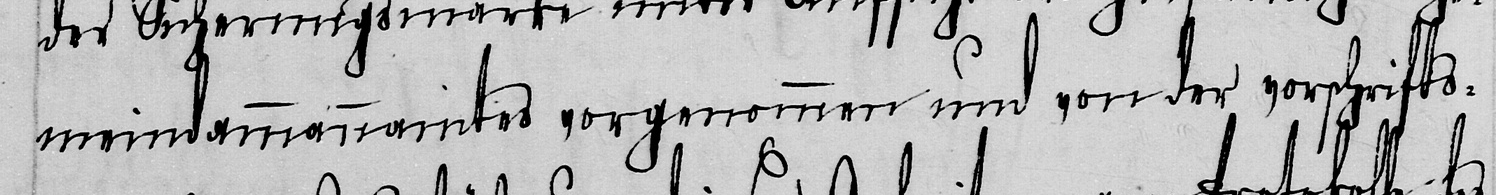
meindammannamtes vorgenommen und von der vorschrifts¬
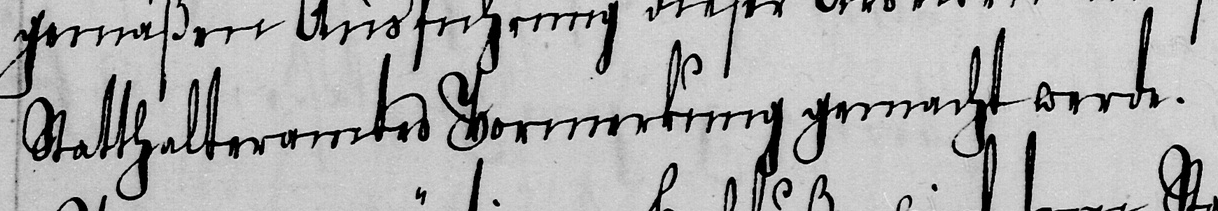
Statthalteramtes Vormerkung gemacht werde.
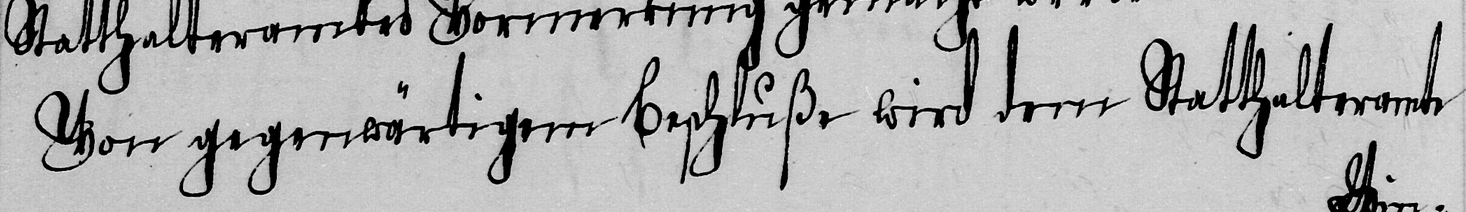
Von gegenwärtigem Beschluße wird dem Statthalteramte
